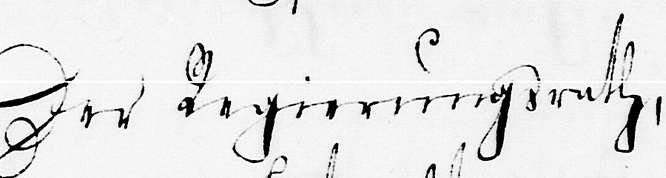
Der Regierungsrath,
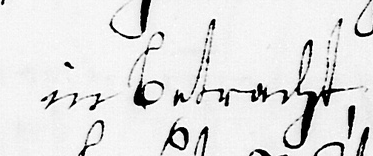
in Betracht,
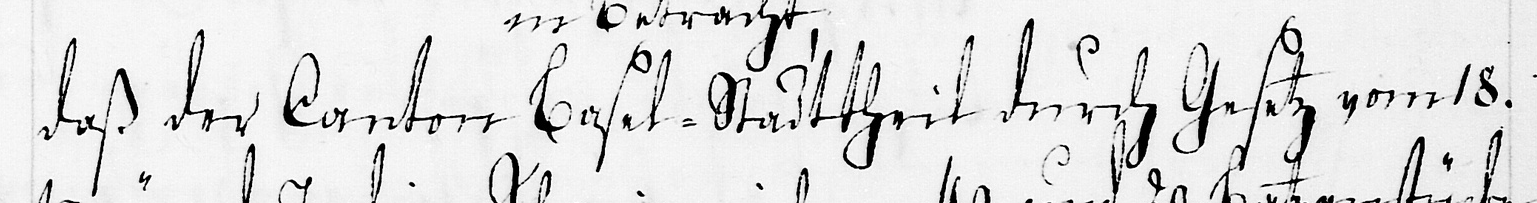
daß der Canton Basel-Stadttheil durch Gesetz vom 18.
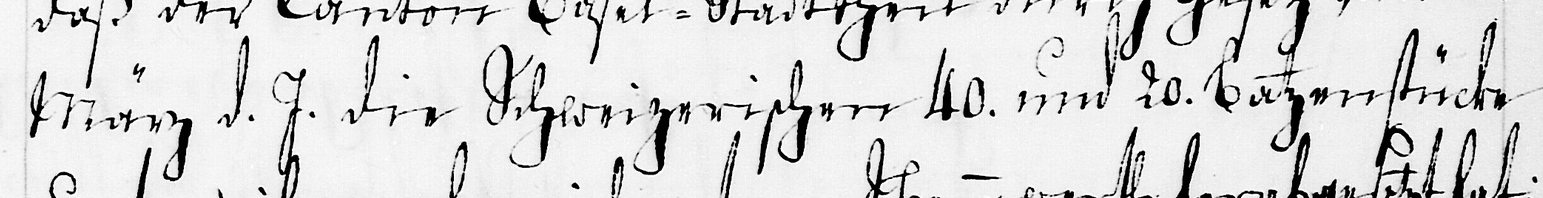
März d. J. die Schweizerischen 40. und 20. Batzenstücke
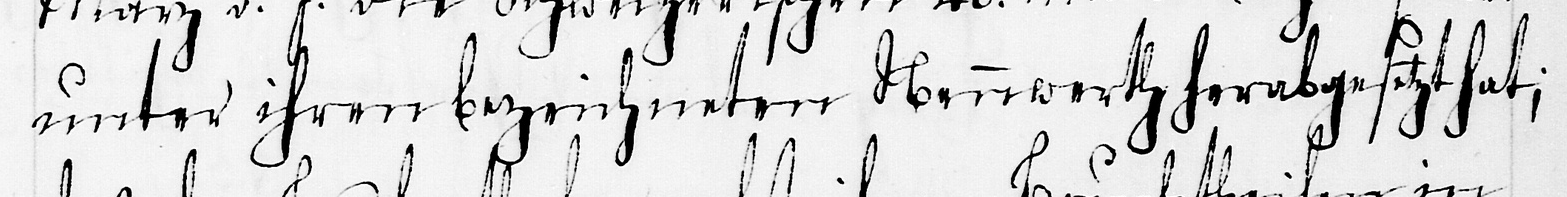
unter ihren bezeichneten Nennwerth herabgesetzt hat;
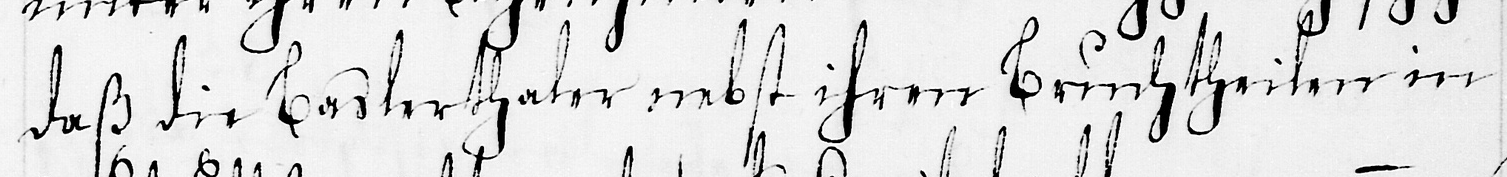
daß die Baslerthaler nebst ihren Bruchtheilen in
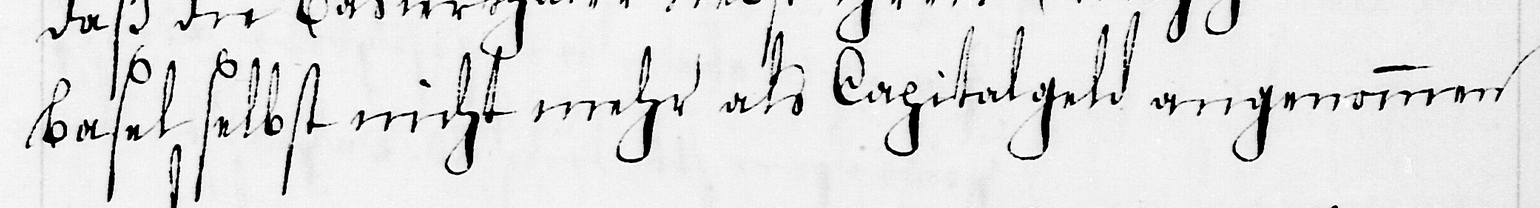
Basel selbst nicht mehr als Capitalgeld angenommen
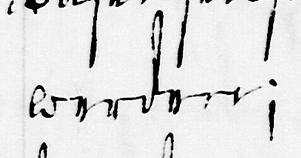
werden;
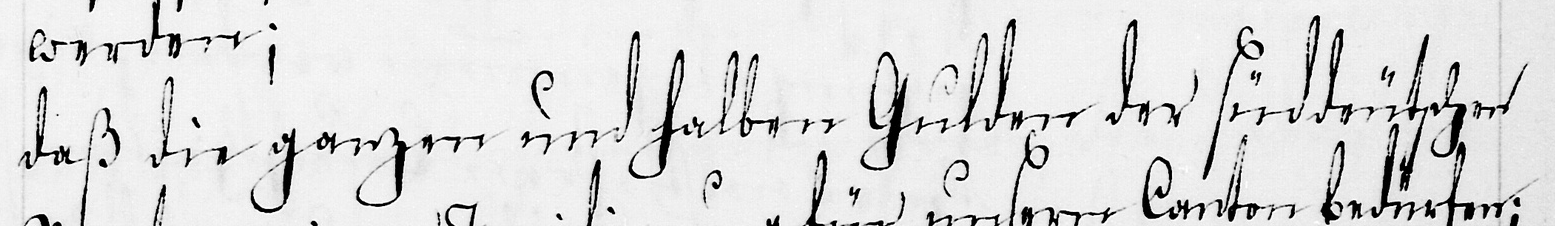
daß die ganzen und halben Gulden der süddeutschen
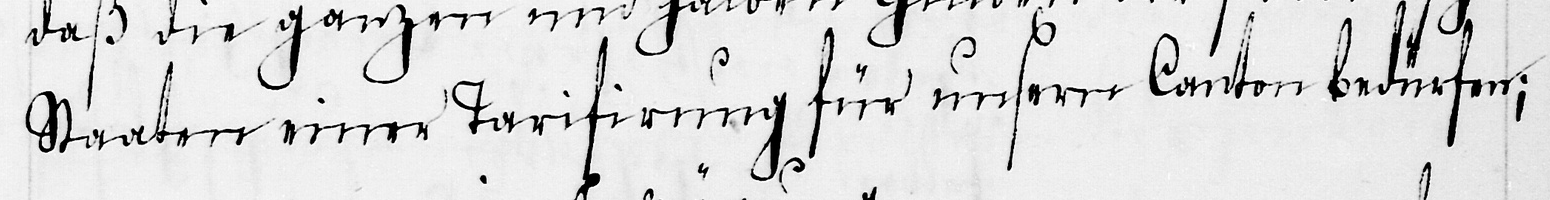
Staaten einer Tarifirung für unsern Canton bedürfen;
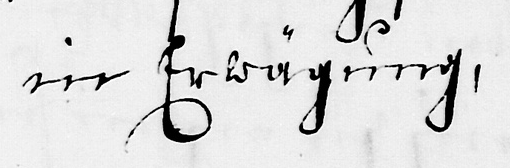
in Erwägung,
